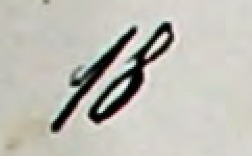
18
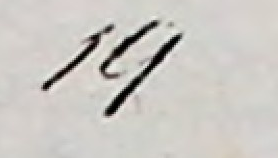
19
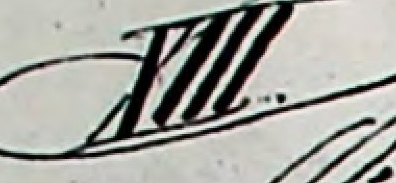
XIII.
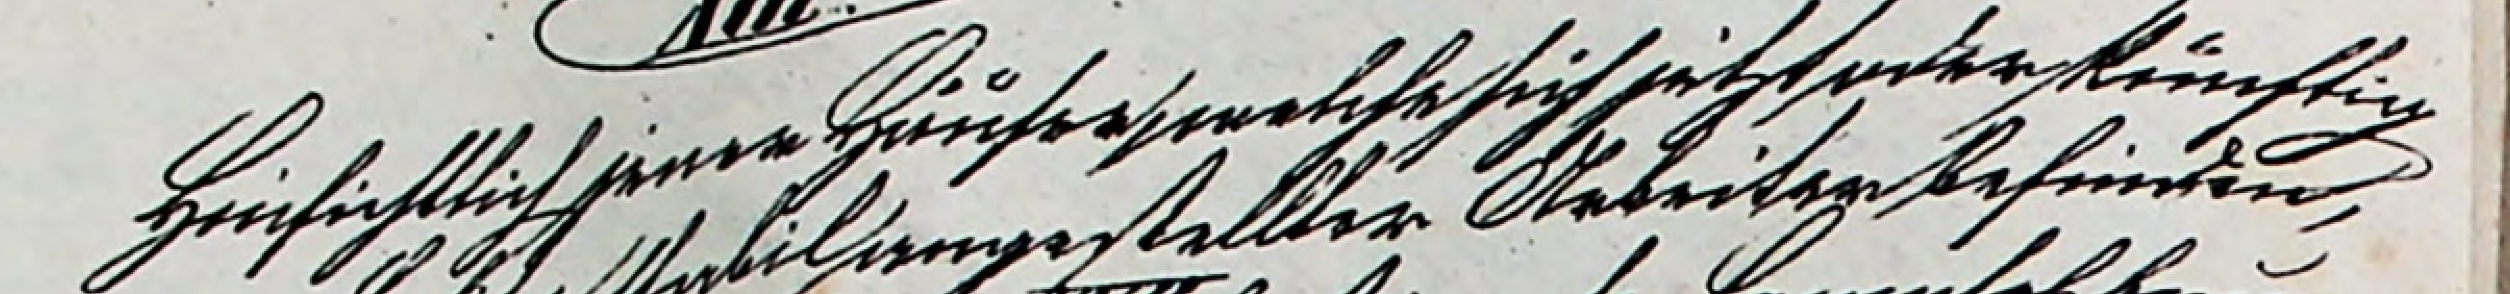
Hinsichtlich jenen Häuser welche sich jetzt oder künftig
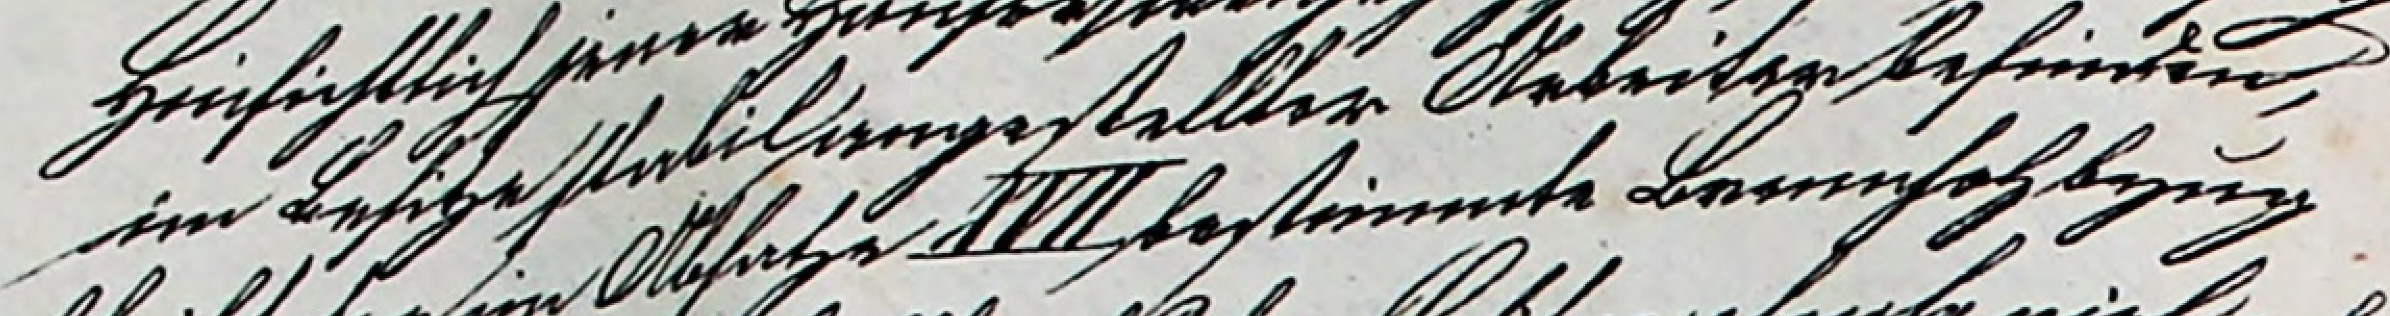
im Besitze stabil angestellter Arbeiter befinden,
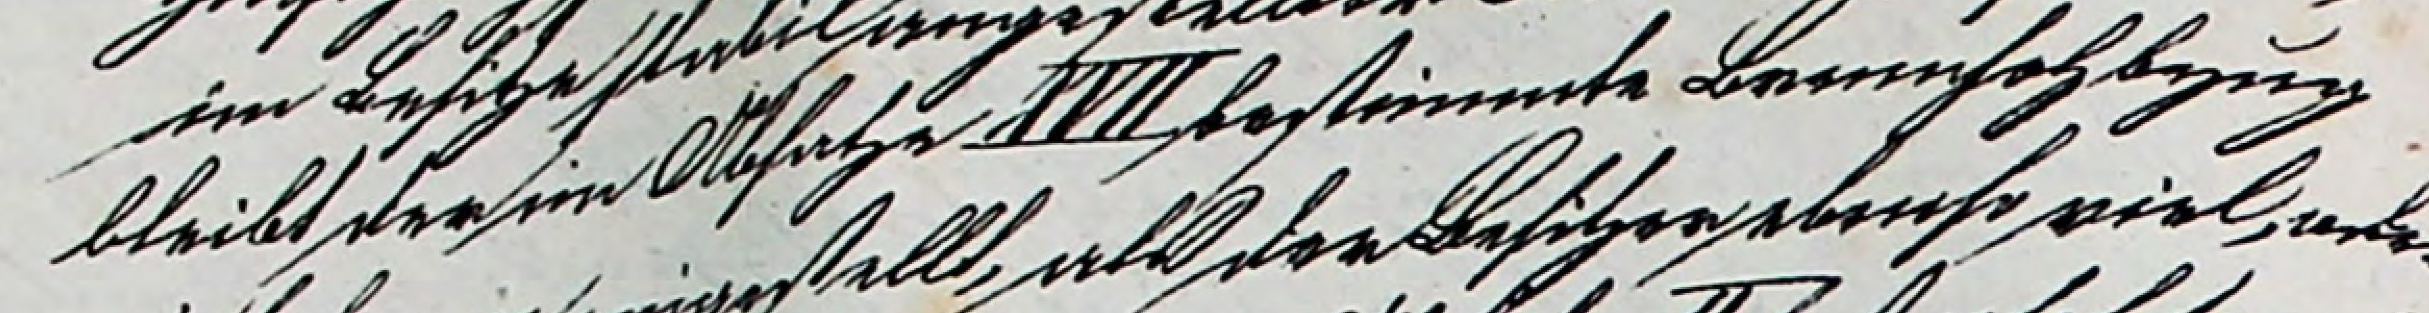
bleibt der im Absatze XVII bestimmte Brennholz bezug
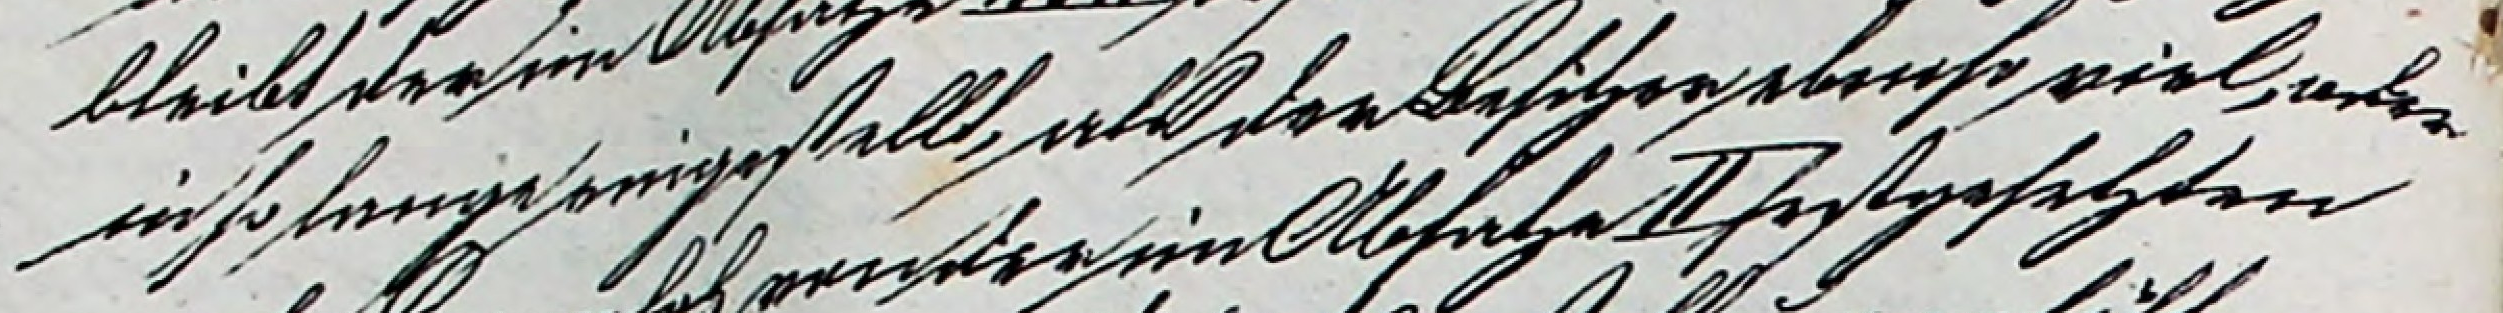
in so lange eingestellt, als der Besitzer ebenhr viel, oder
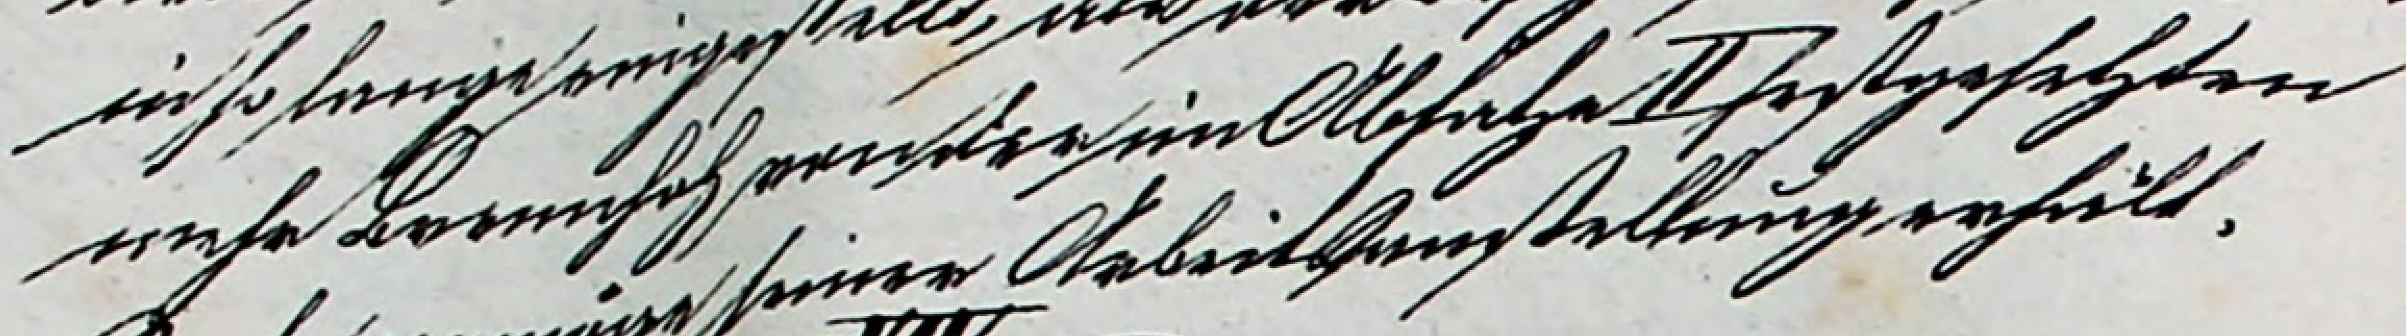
mehr Brennholz von der im Absatze II festgesetzten
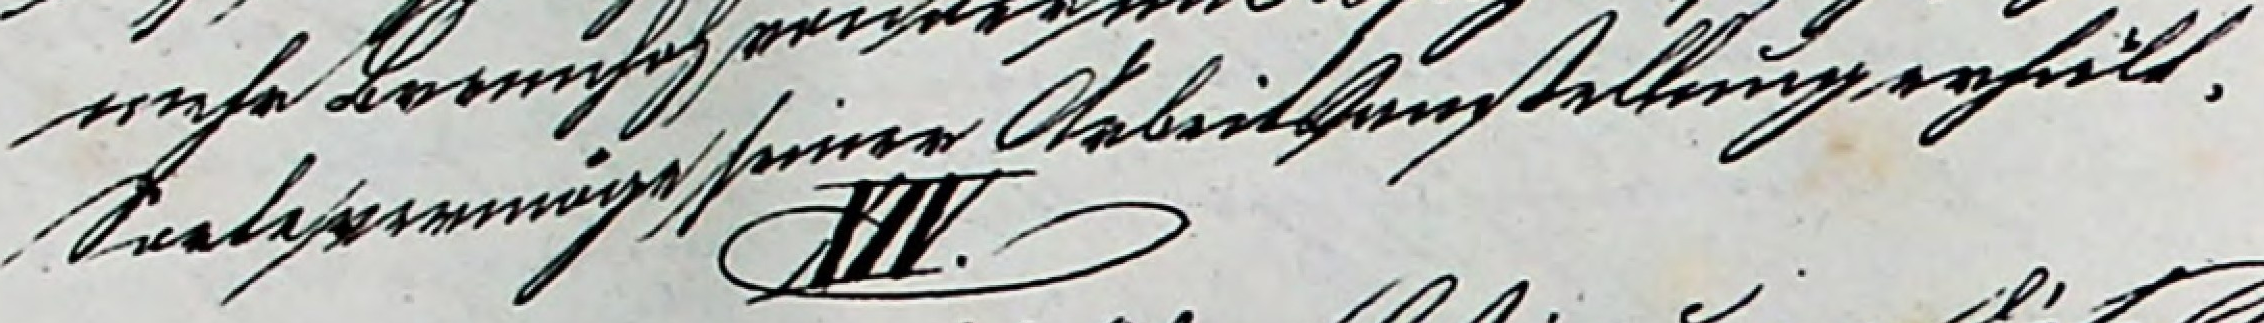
Sorte vermöge seiner Arbeitsanstellung erhält.
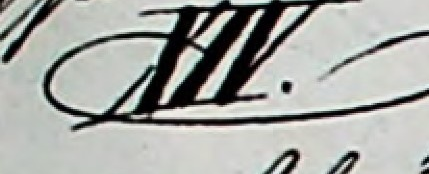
XIV.
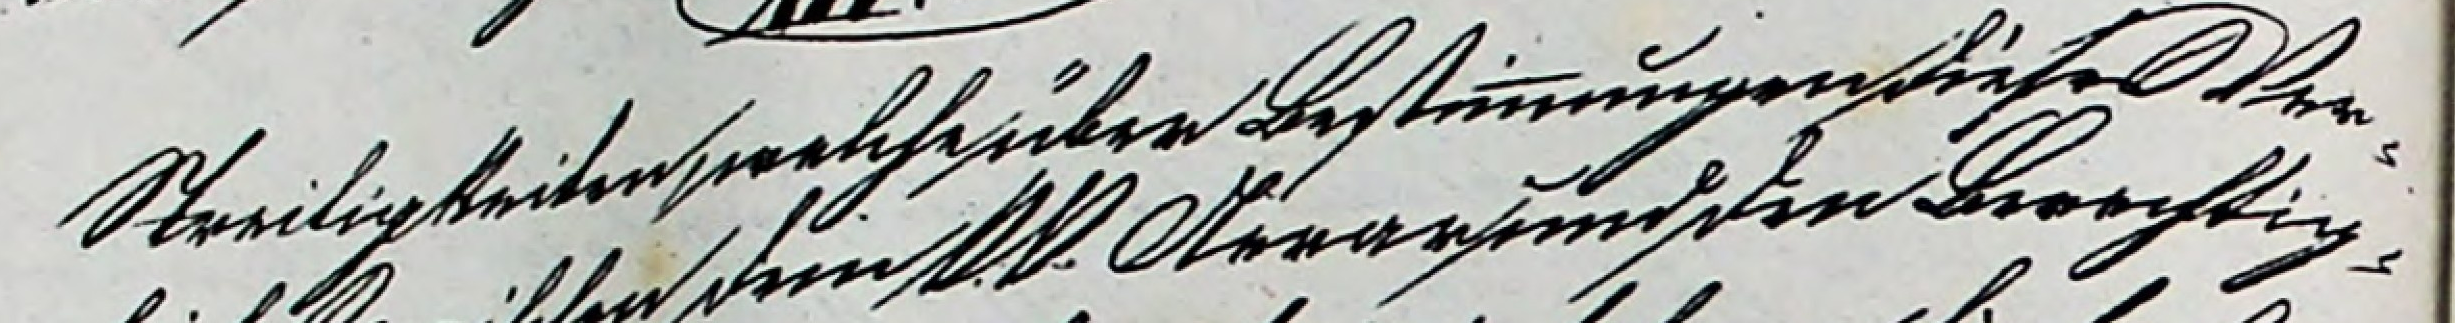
Streitigkeiten welche über Bestimmungen dieses Ver„
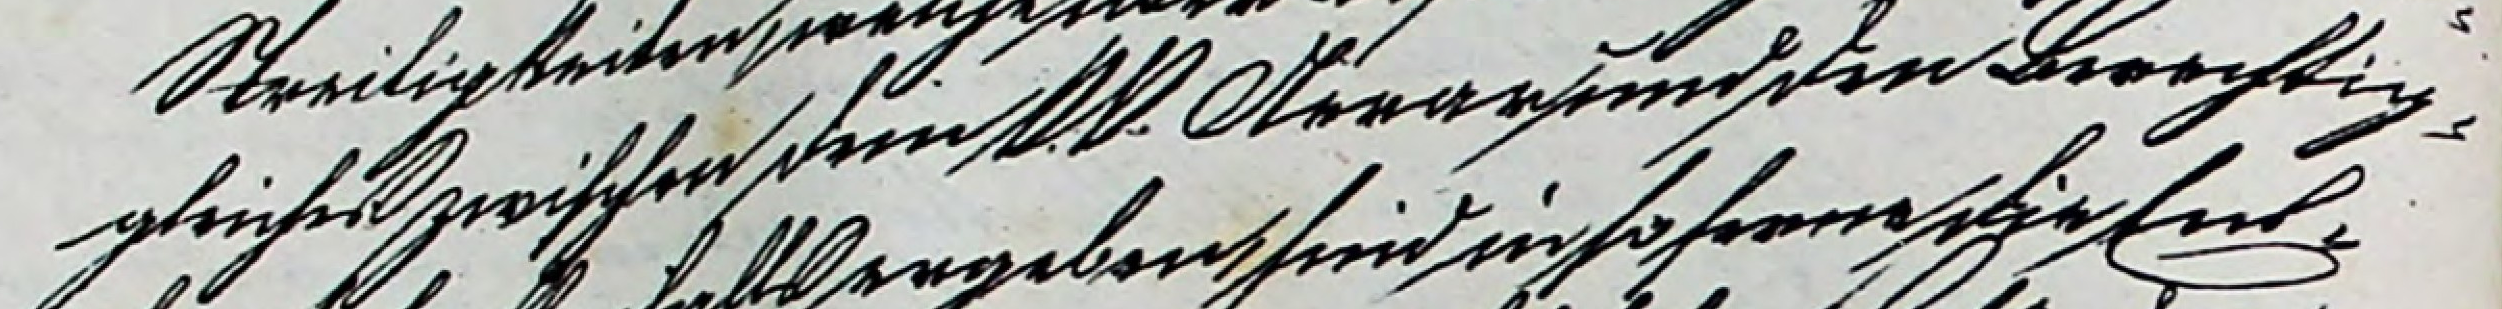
gleiches zwischen dem k.k. Aerar und den Berechtig„
